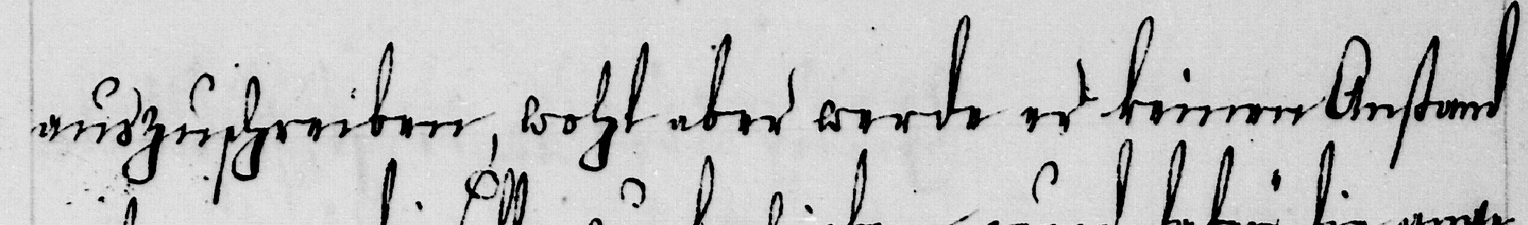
auszuschreiben, wohl aber werde er keinen Anstand
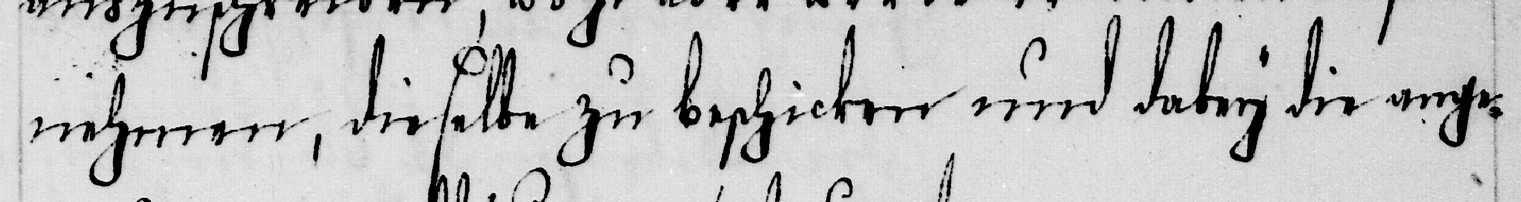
nehmen, dieselbe zu beschicken und dabey die ange¬
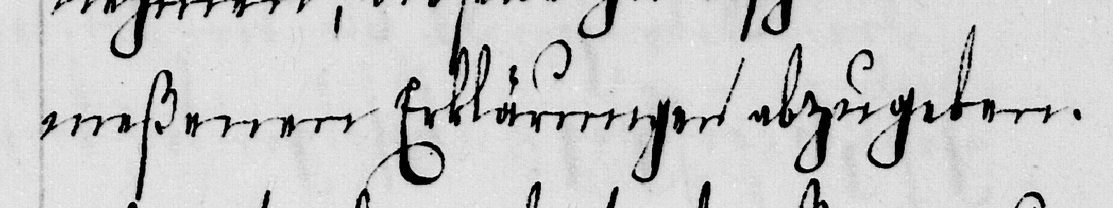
meßenen Erklärungen abzugeben.
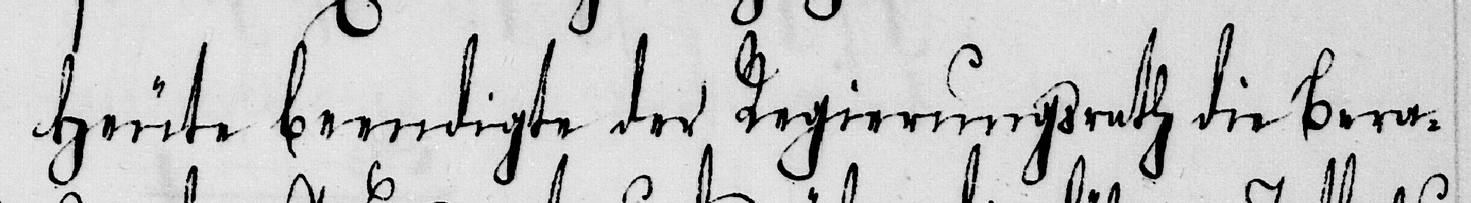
Heute beendigte der Regierungsrath die Bera¬
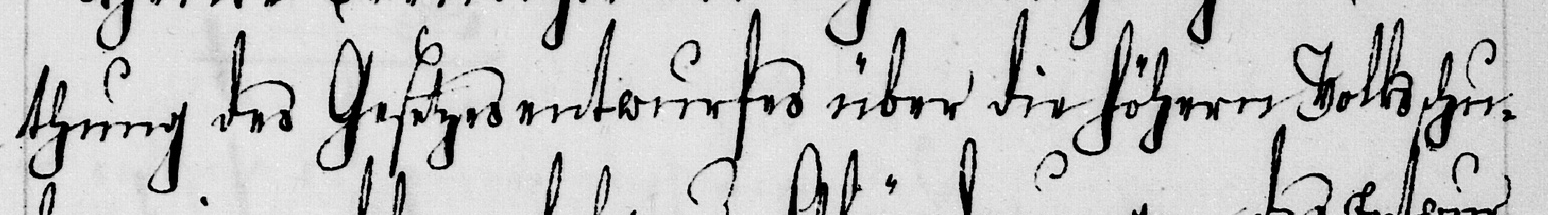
thung des Gesetzesentwurfes über die Höhern Volksschu¬
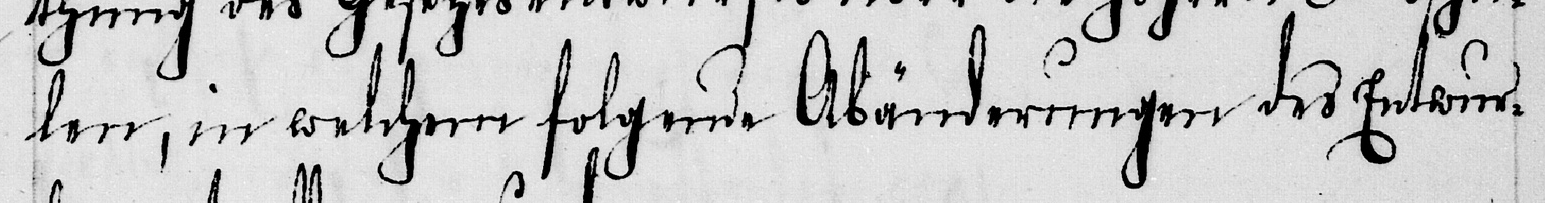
len, in welchen folgende Abänderungen des Entwur¬
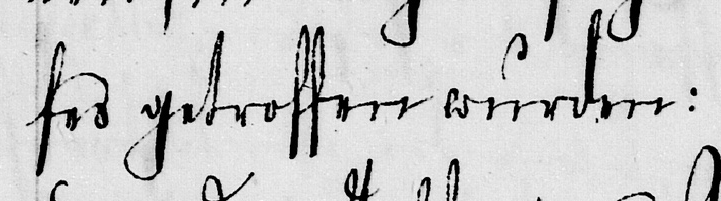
fes getroffen wurden:
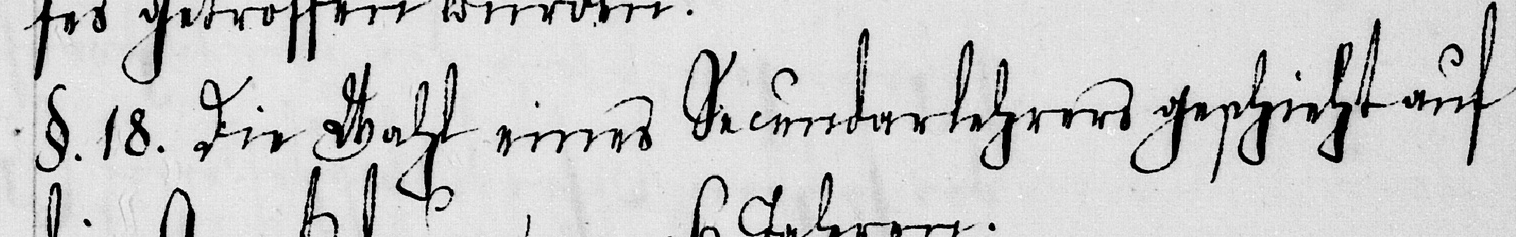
§. 18. Die Wahl eines Secundarlehrers geschieht auf
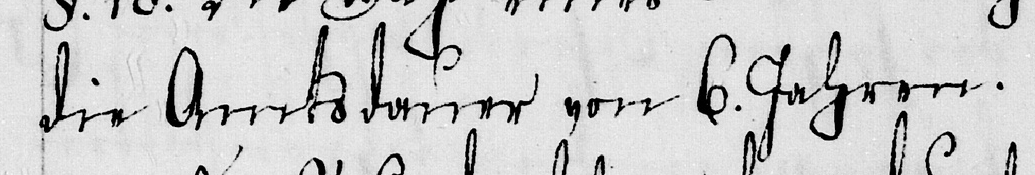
die Amtsdauer von 6. Jahren.
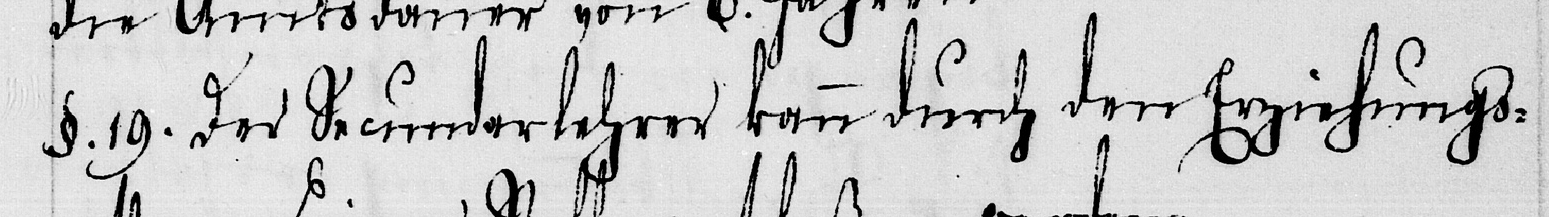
§. 19. Der Secundarlehrer kann durch den Erziehungs¬
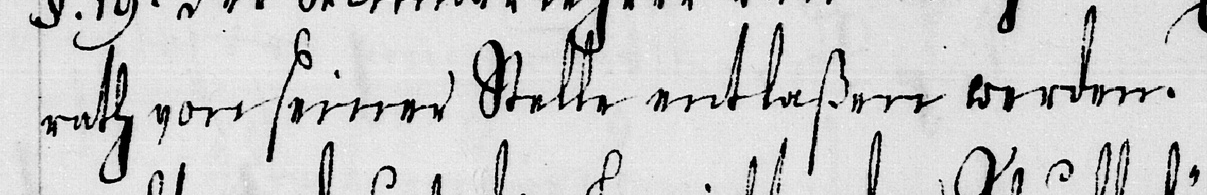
rath von seiner Stelle entlaßen werden.
